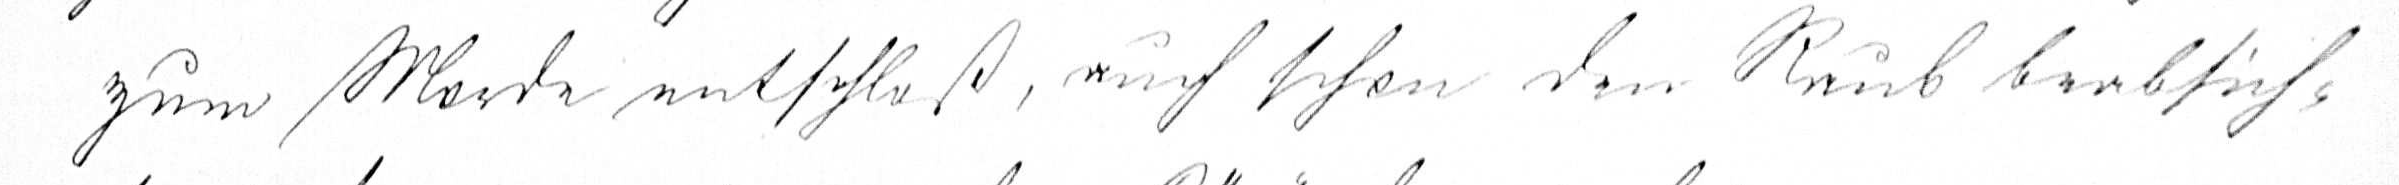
zum Morde entschloß, auch schon den Raub beabsich¬
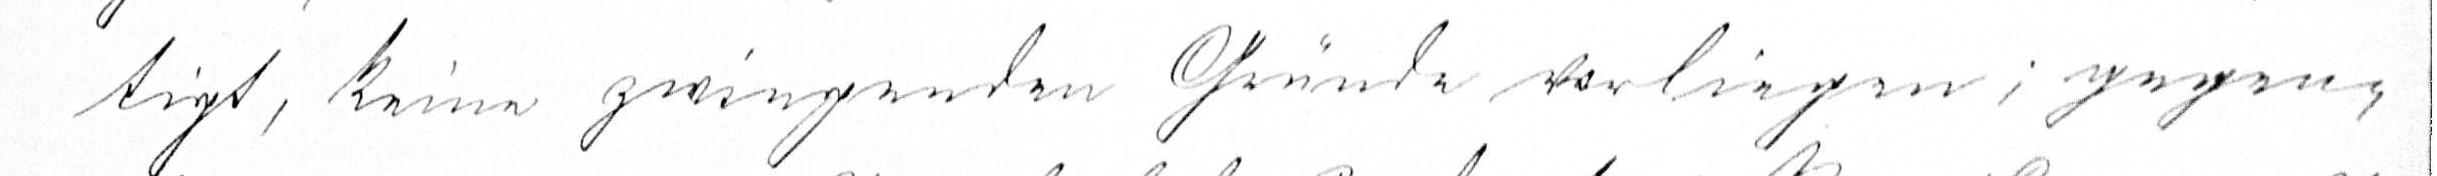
tigt, keine zwingende Gründe vorliegen, gegen¬
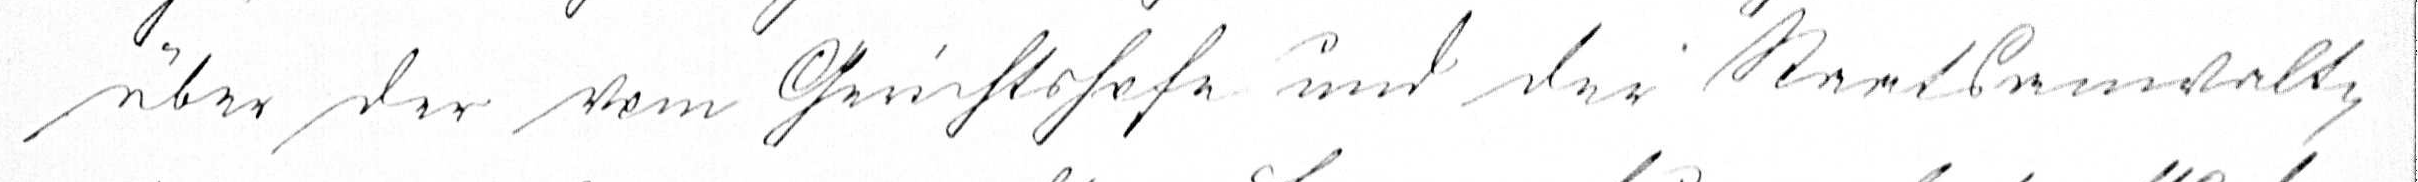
über der vo Gerichtshofe und der Staatsanwalt¬
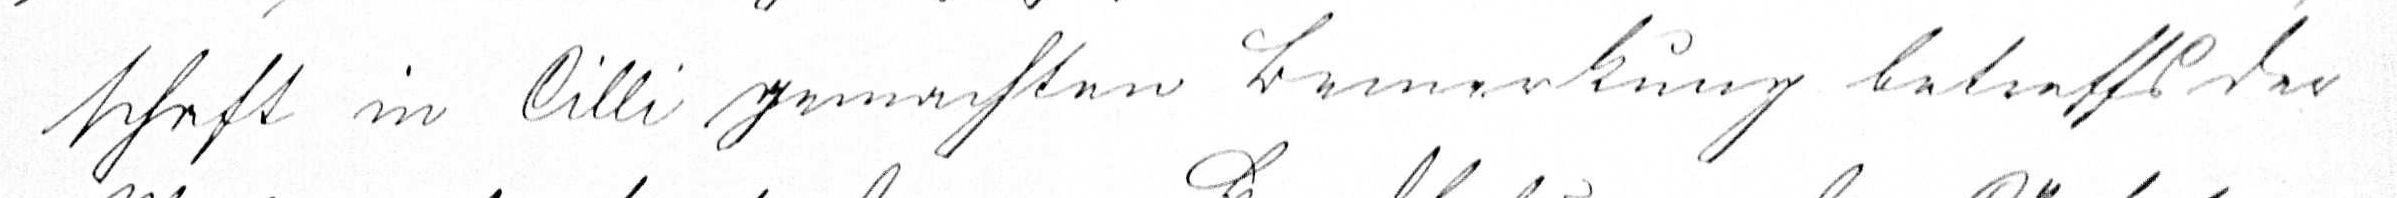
schaft in Cilli gemachten Bemerkung betreffs der
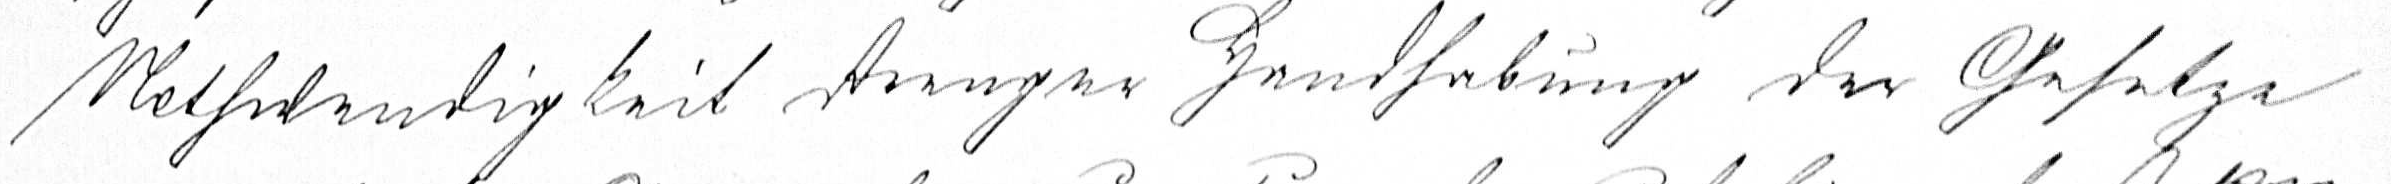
Nothwendigkeit strenger Handhabung der Gesetze
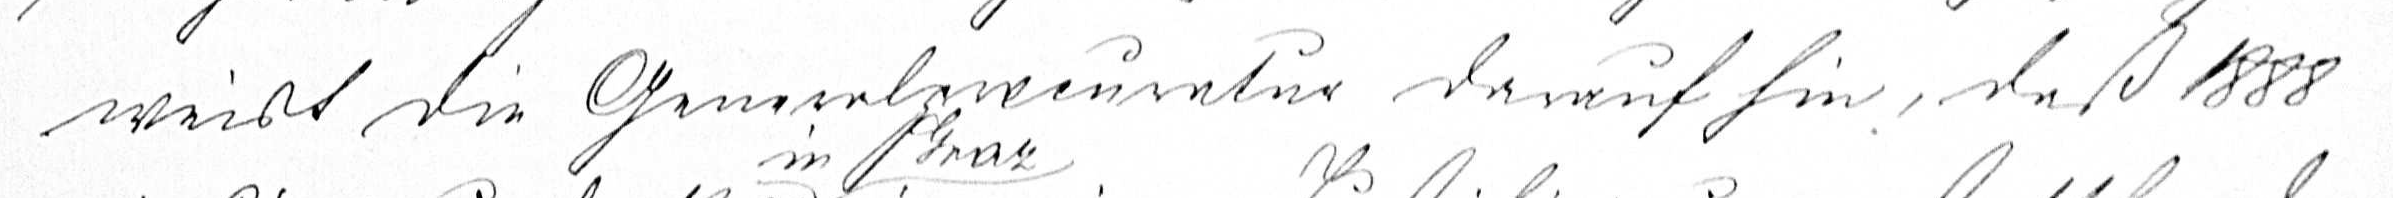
weist die Generalprocuratur darauf hin, daß 1888
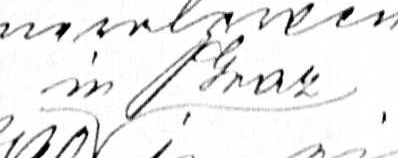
in Graz
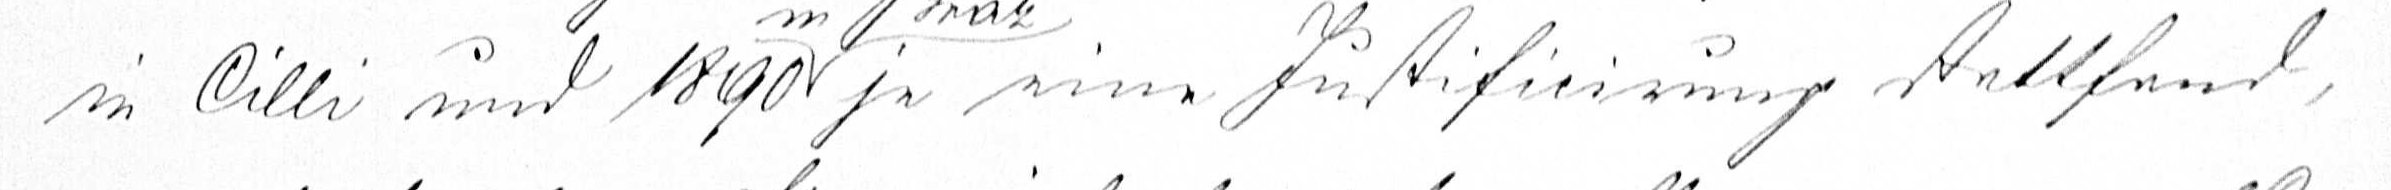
in Cilli und 1890 je eine Justificirung stattfand,
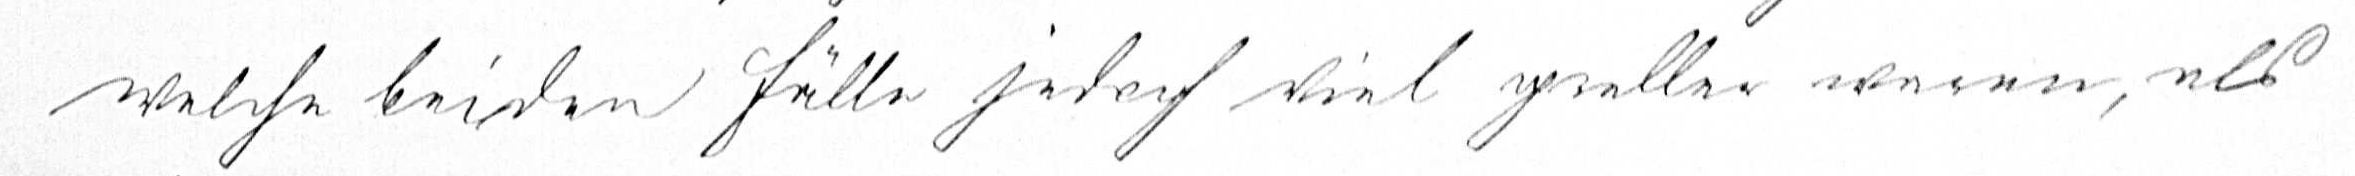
welche beiden Fälle jedoch viel greller waren, als
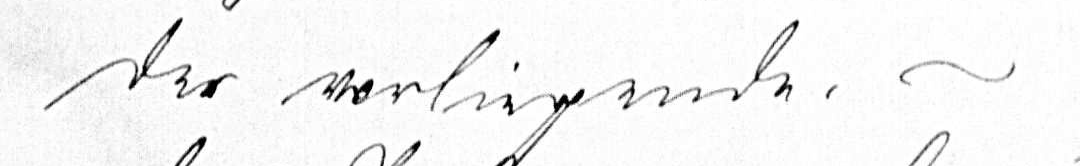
der vorliegende.
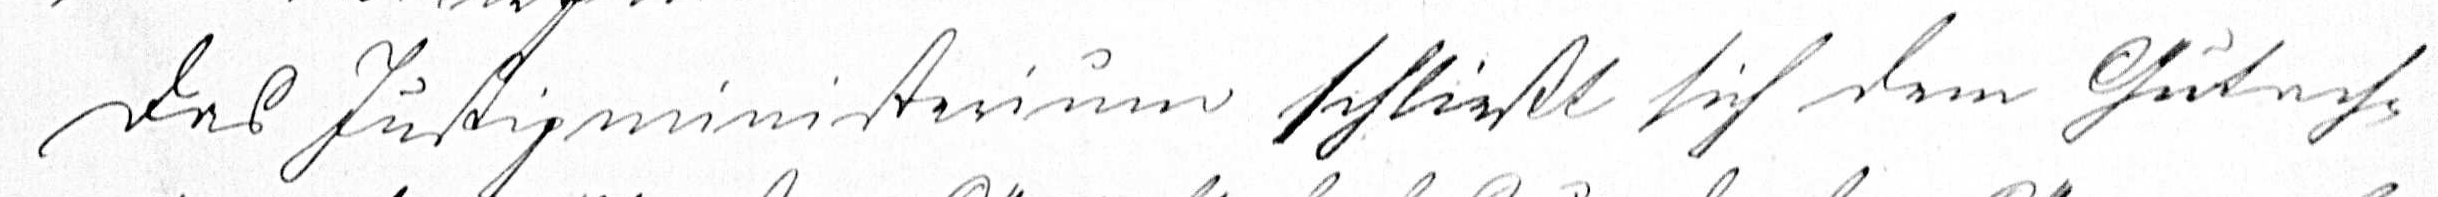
Das Justizministerium schließt sich dem Gutach¬
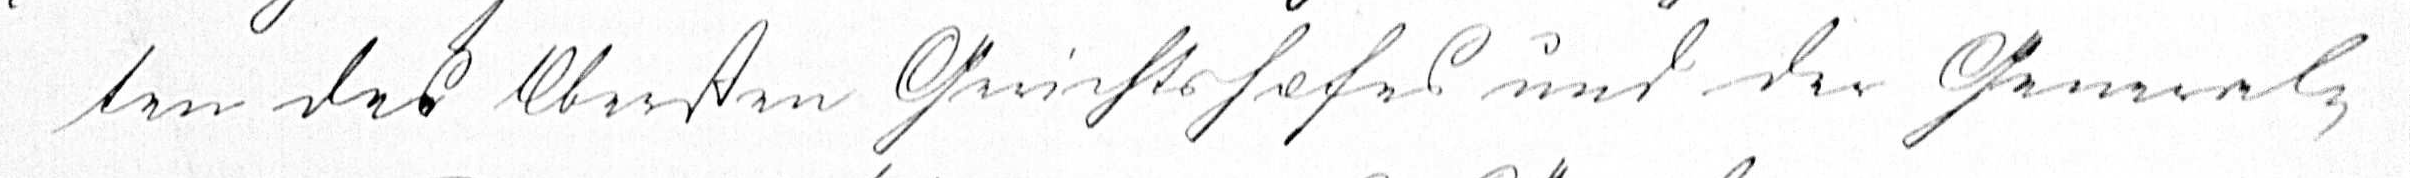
ten des Obersten Gerichtshofes und der General-
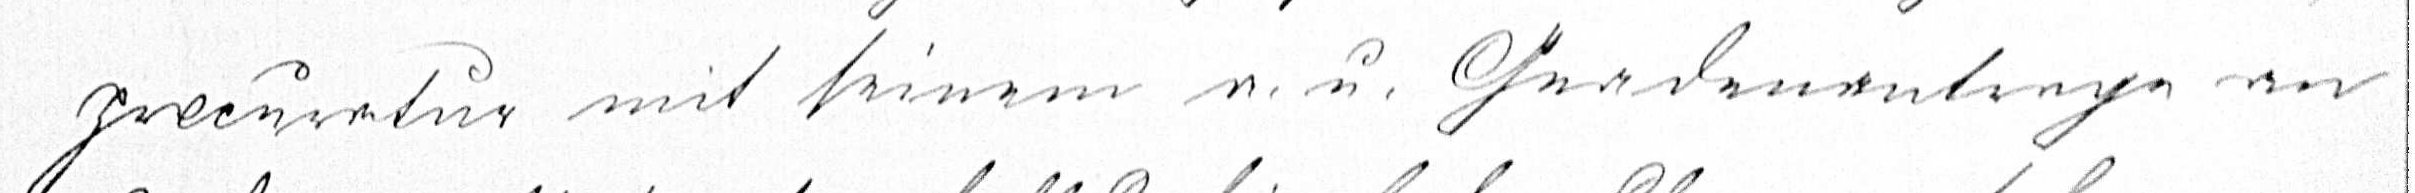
procuratur mit seinem a. u. Gnadenantrage an
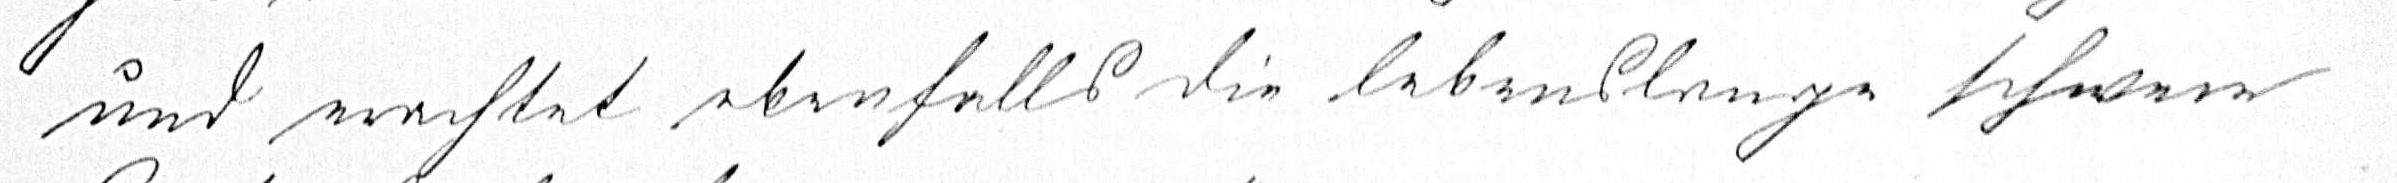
und erachtet ebenfalls die lebenslange schwere
